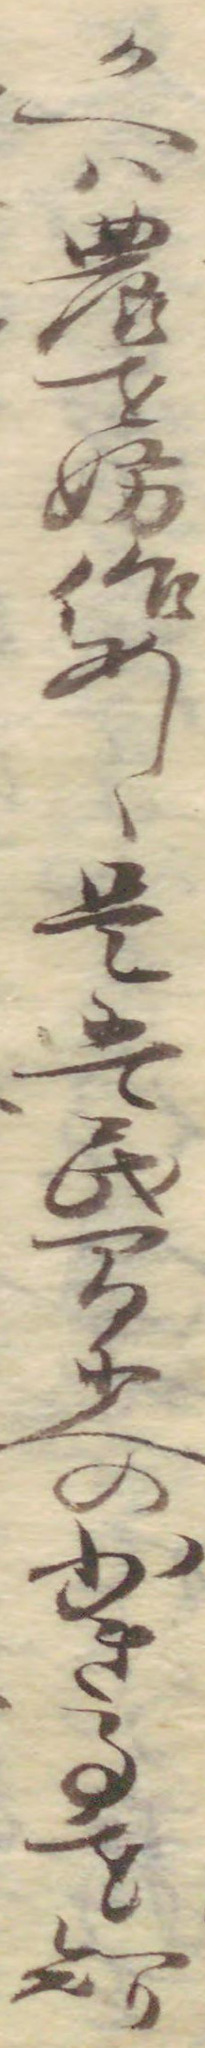かへば農を妨作あしゝ是にて民間に人の少き事を知り
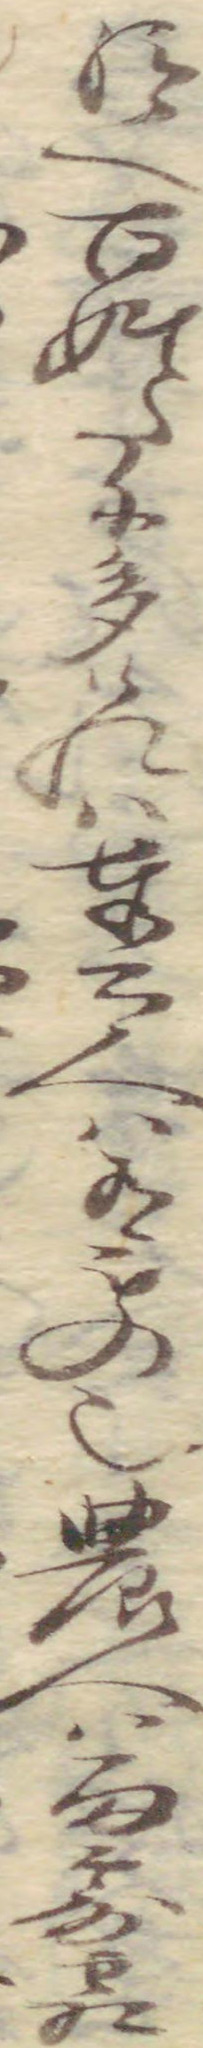給へ百姓たに多けれは奉公人は有もの也農人は雨露霜
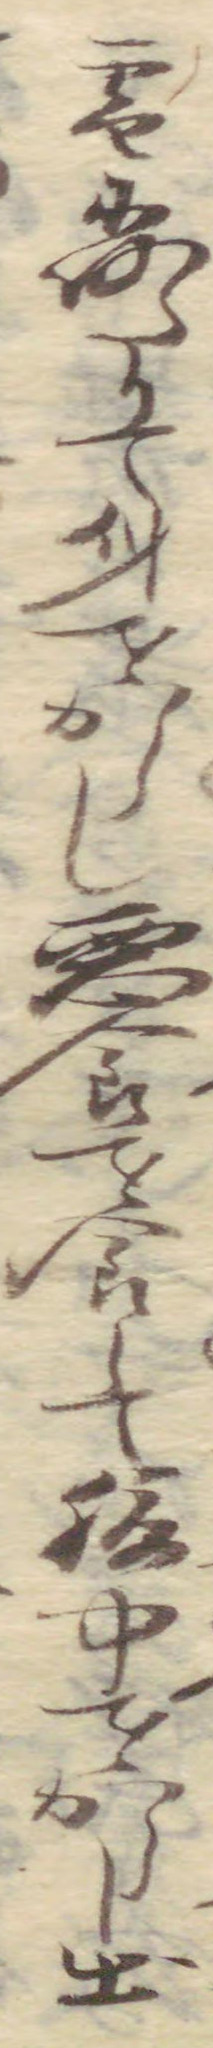雪にあたりて身をからし悪食を食して腹中をからし出
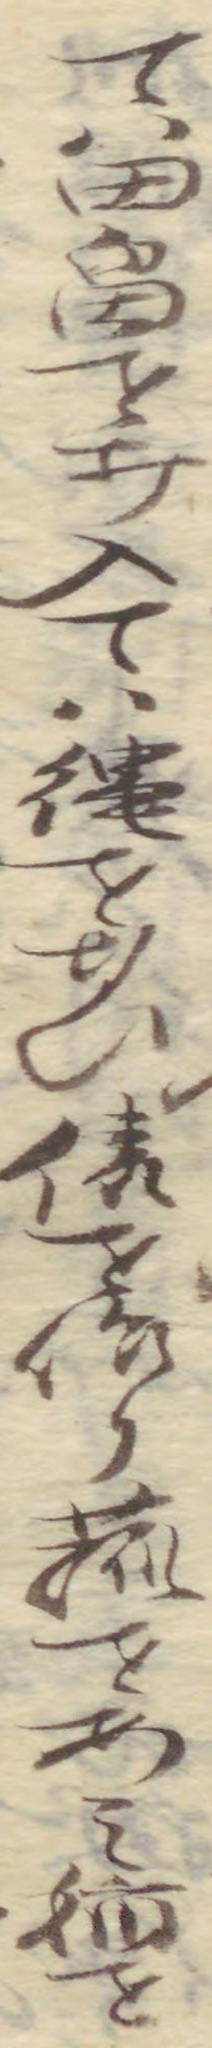ては田畠を打入ては縄をなひ俵を作り菰をあみ稲を
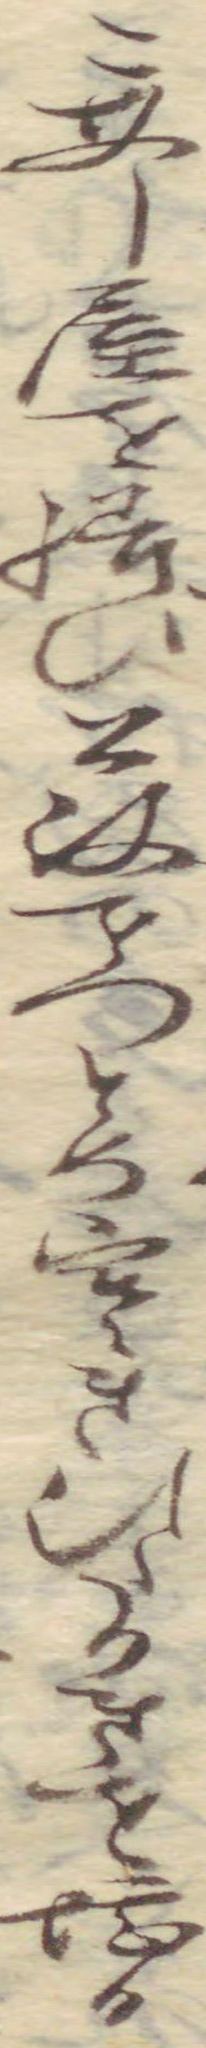こなし屋を繕ひ公役をつとめ寒きひたるきを堪る
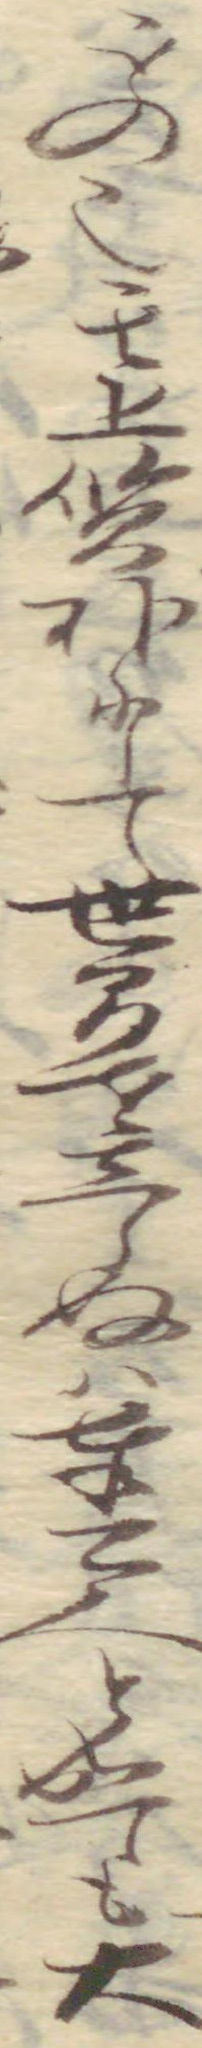もの也其上質朴にして世間をしらぬは奉公人と成ても大
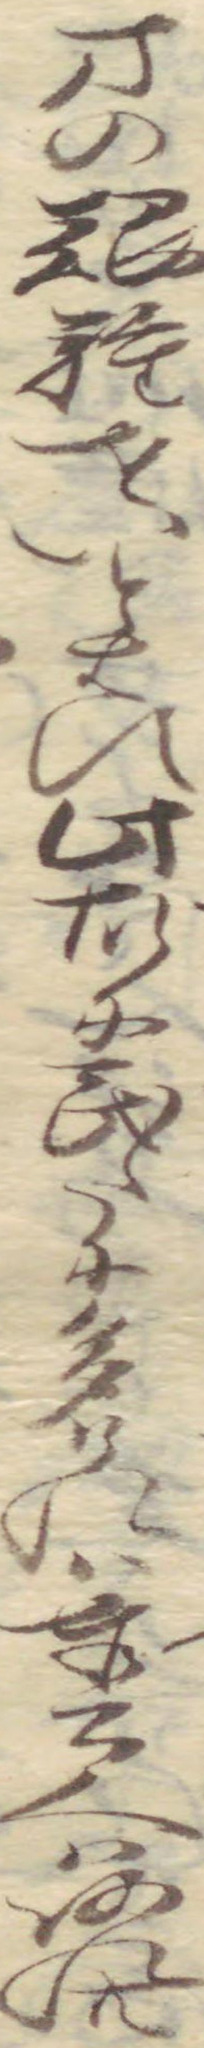方の艱難をいとはす此故に民たに多けれは奉公人はあれ共
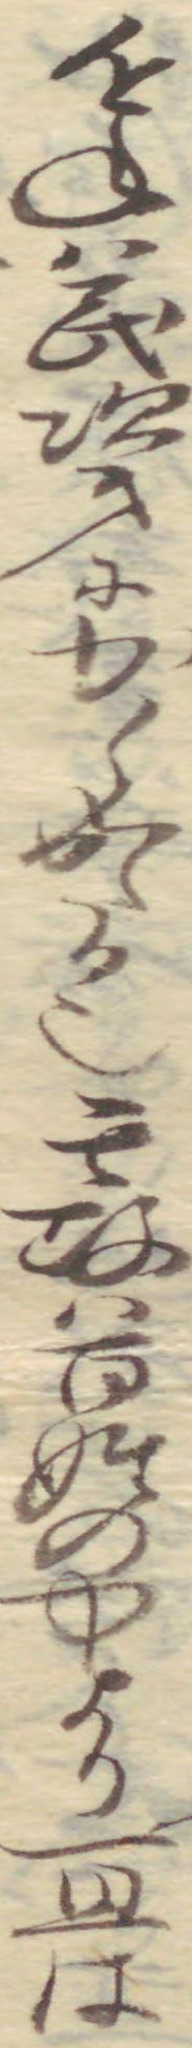近年は民次第に少く成たる也其故は百姓の中より一旦は
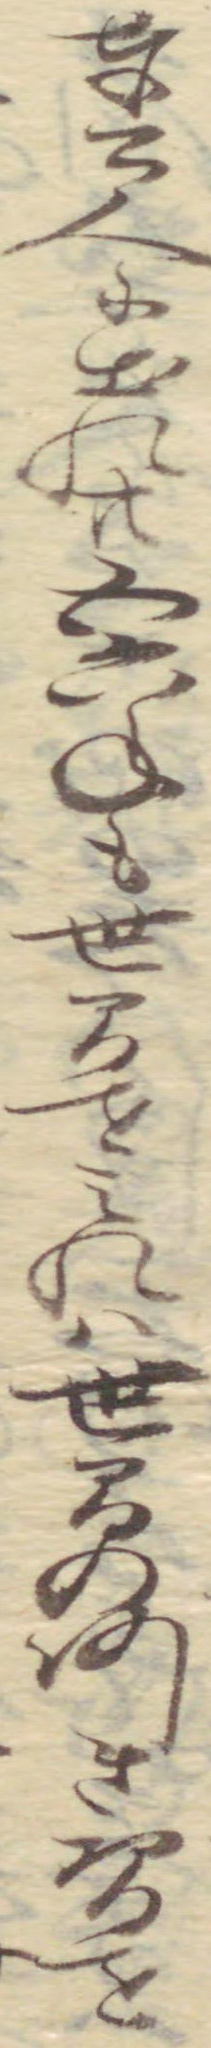奉公人に出れ共五六年も世間をみれは世間のあしき習を
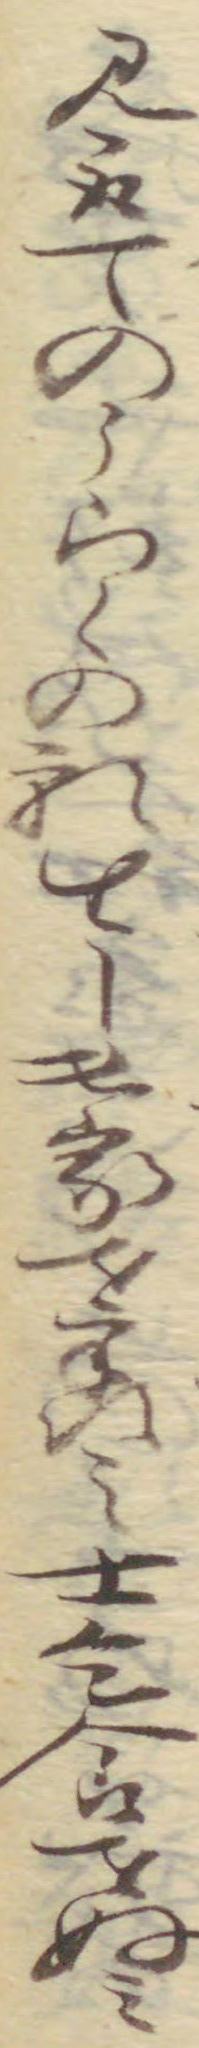見取てのうらくの願生し出家を羨み士乞食せぬみ
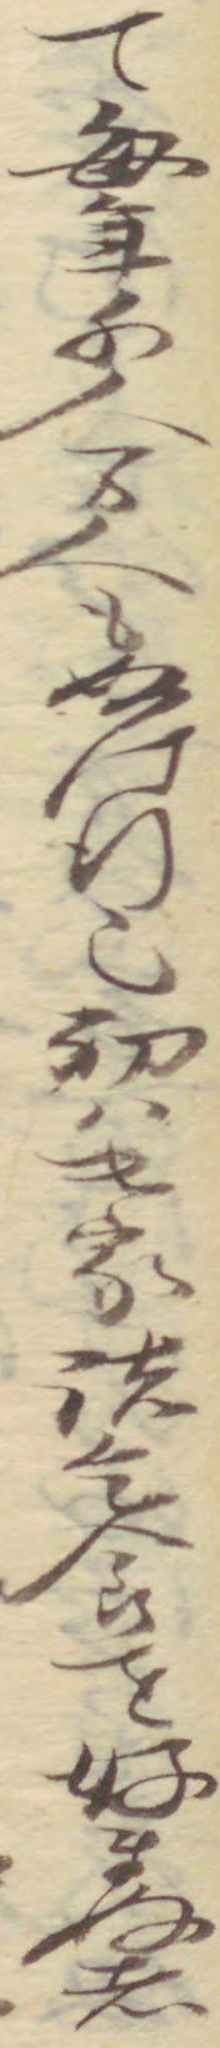て毎年千人万人もぬけ行也初は出家諸乞食を好まぬ者
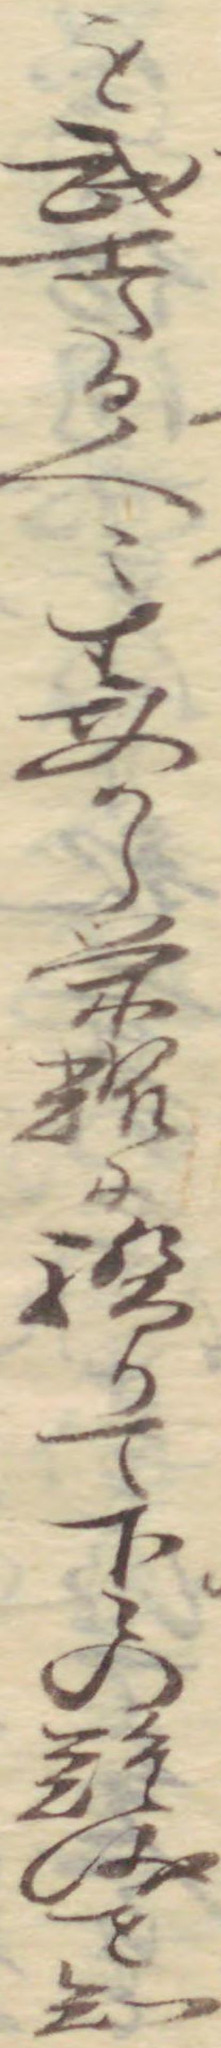も武士たる人〻生なから栄耀に驕りて下〻の難儀を知
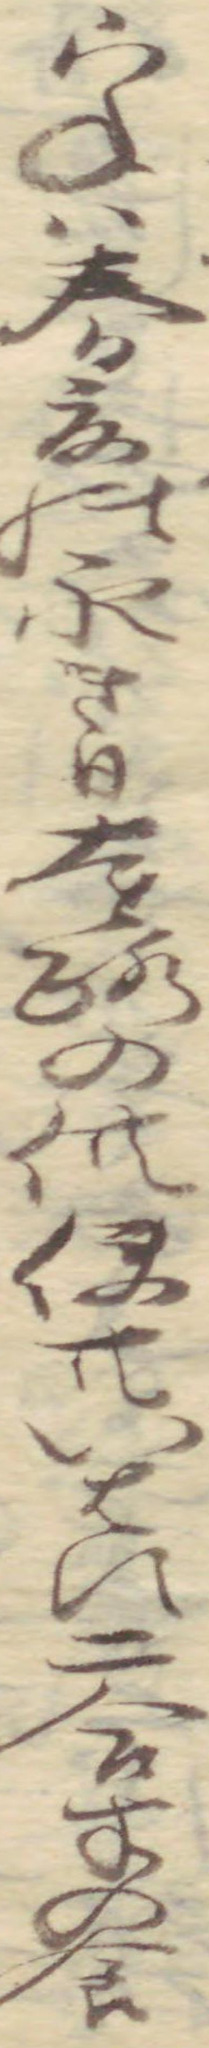らねは春夏の永き日遠路の供使共いはす二合半の食
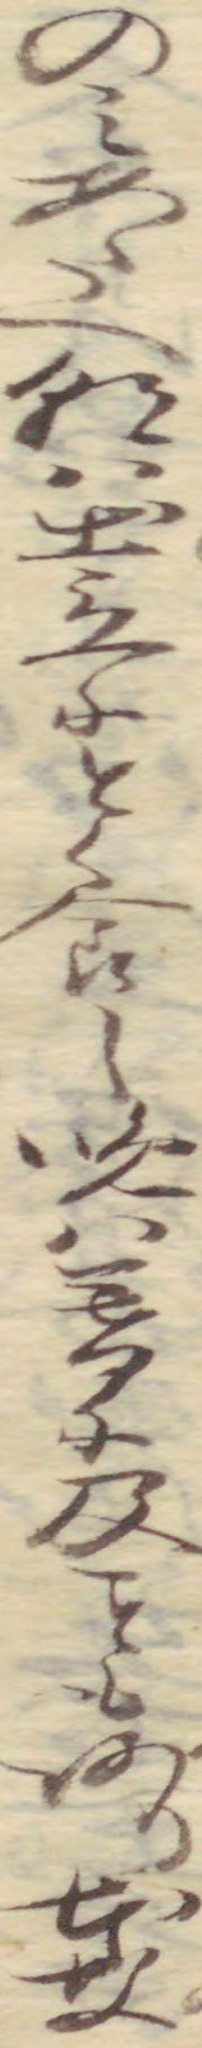のみあたへ朝は出立にとく食し晩は暮に及事もあり本な
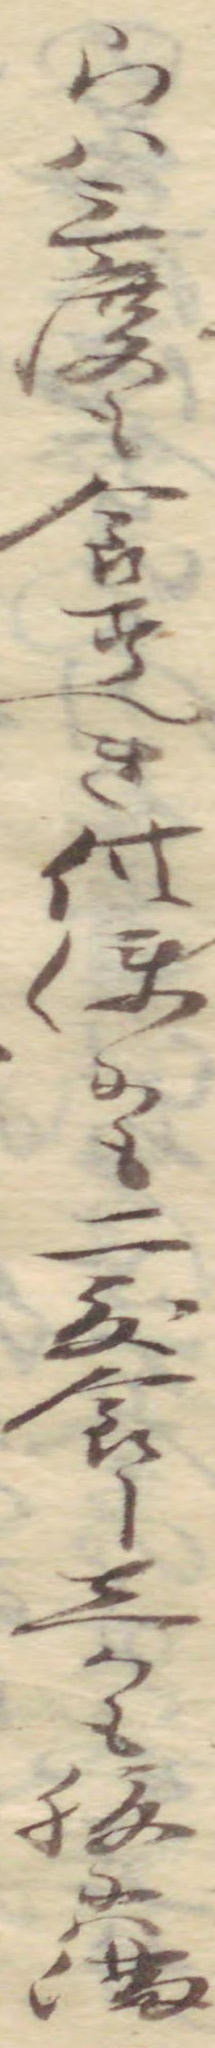らは三度も食すへき供使にも二度食ししかも腹には満
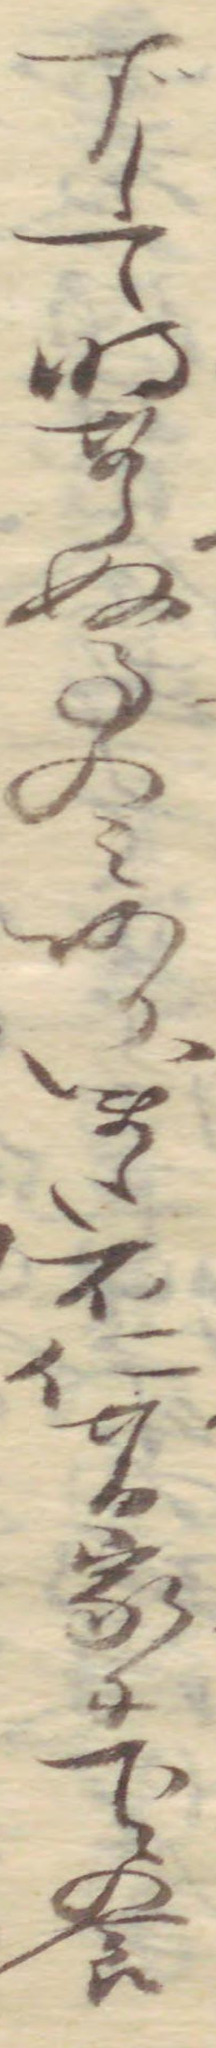ずして時ならぬ事のみありいまた不仁なる家に下〻の食
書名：鶯宿雑記. 巻263-264
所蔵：国立国会図書館 National Diet Library, JAPAN
